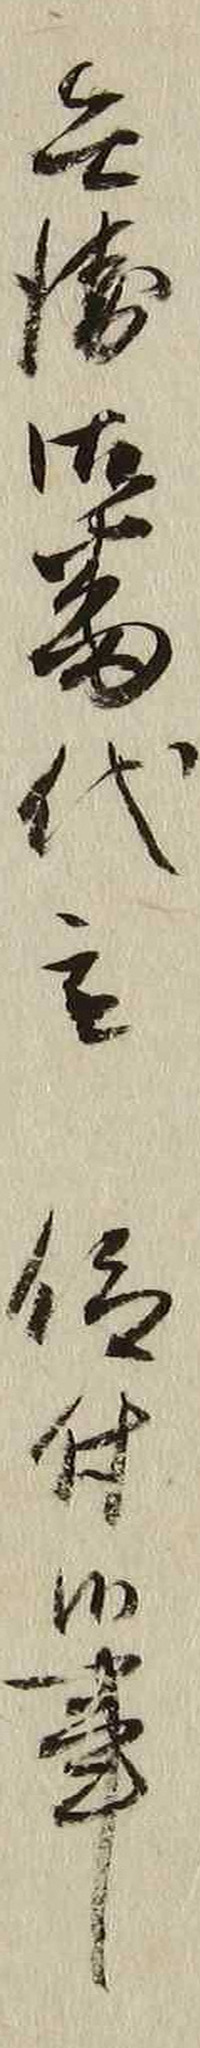兵衛御番代被仰付候事
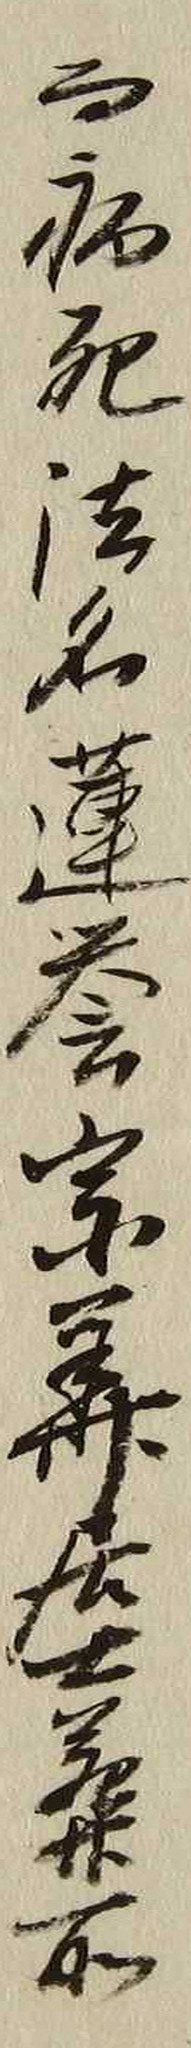而病死法名蓮誉宗華居士葬所
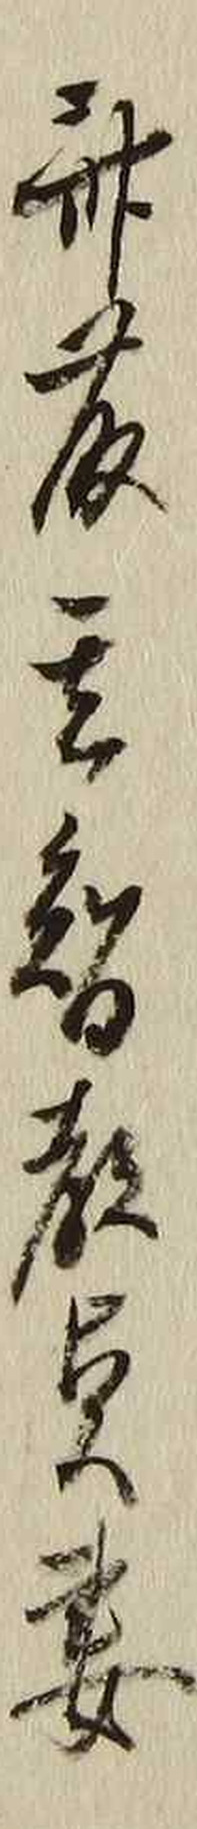斎藤玄智教貞妻
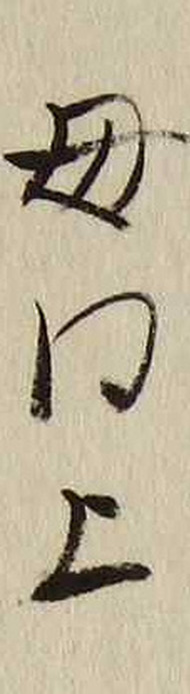母同上
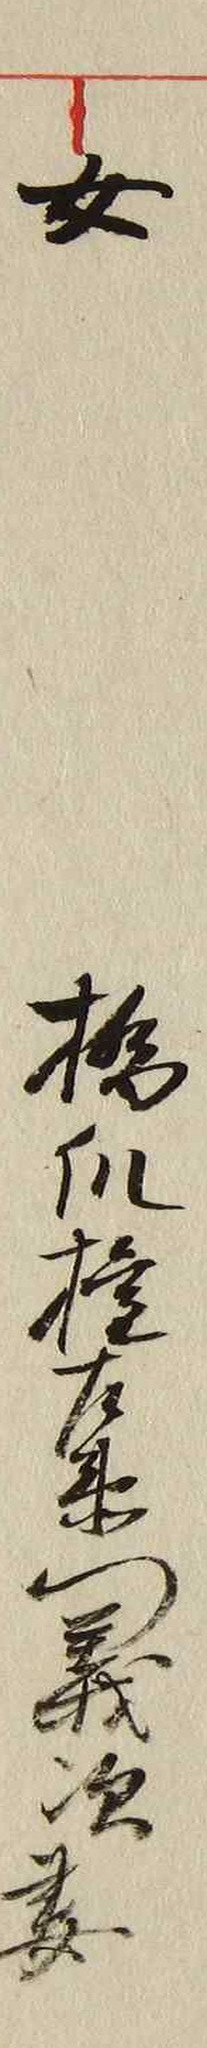女橋爪権左衛門義次妻
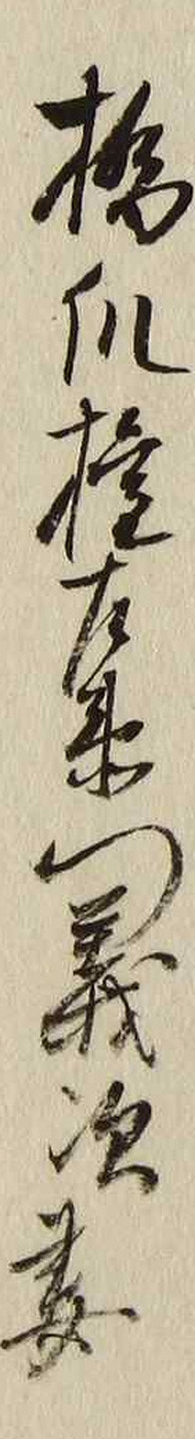女橋爪権左衛門義次妻
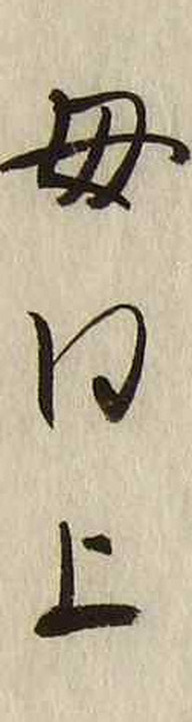母同上

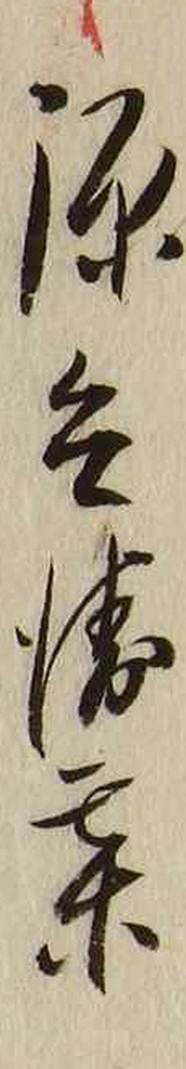源兵衛某
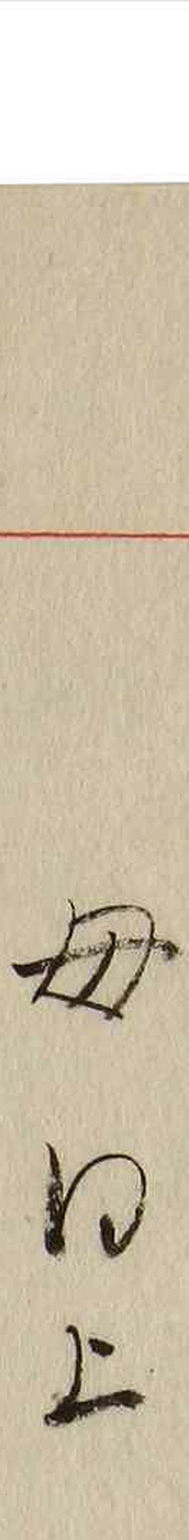母同上
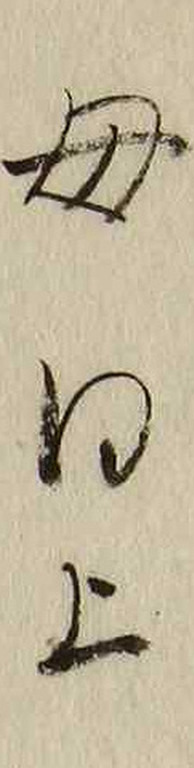母同上
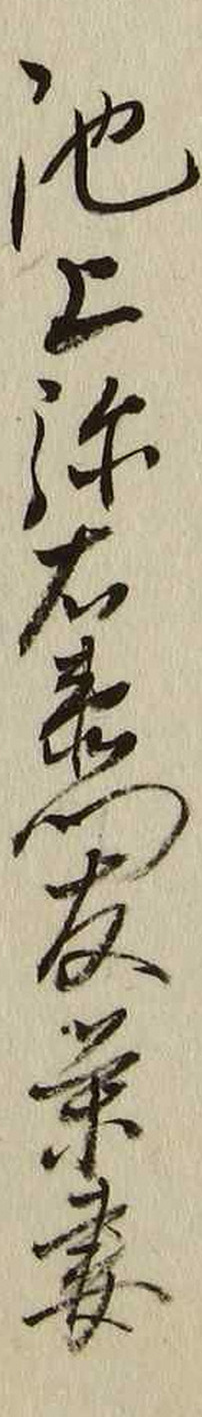女池上弥右衛門友栄妻
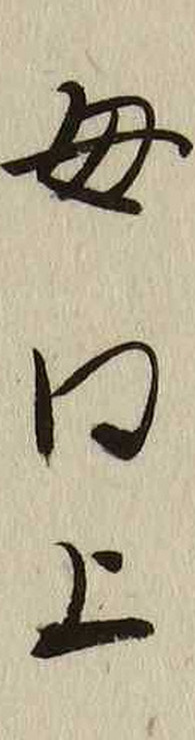母同上
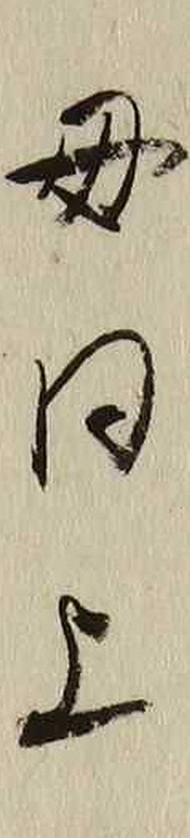母同上
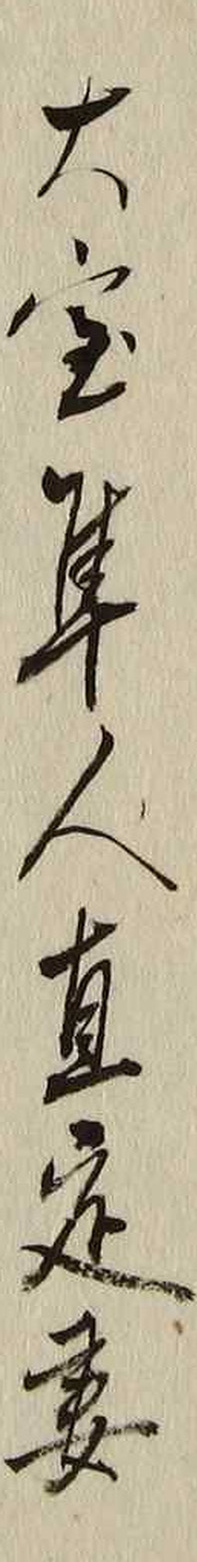女大宝隼人直定妻
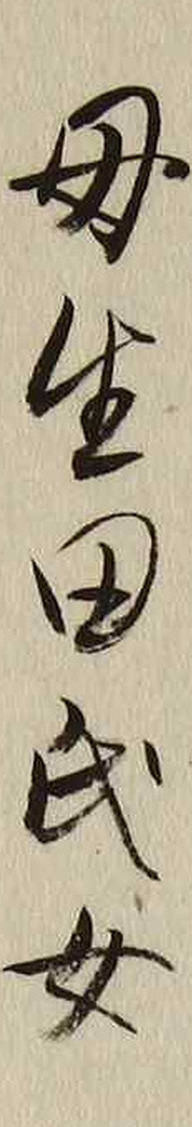母生田氏女
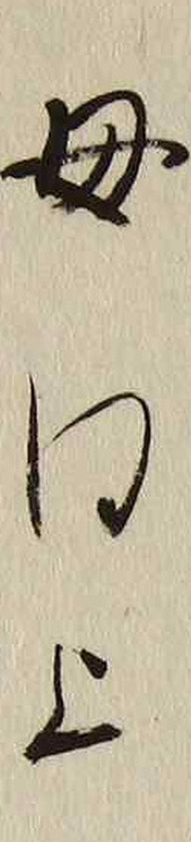母同上
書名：諸士系譜　巻之350　せ之部1冊全
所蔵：会津若松市立会津図書館
